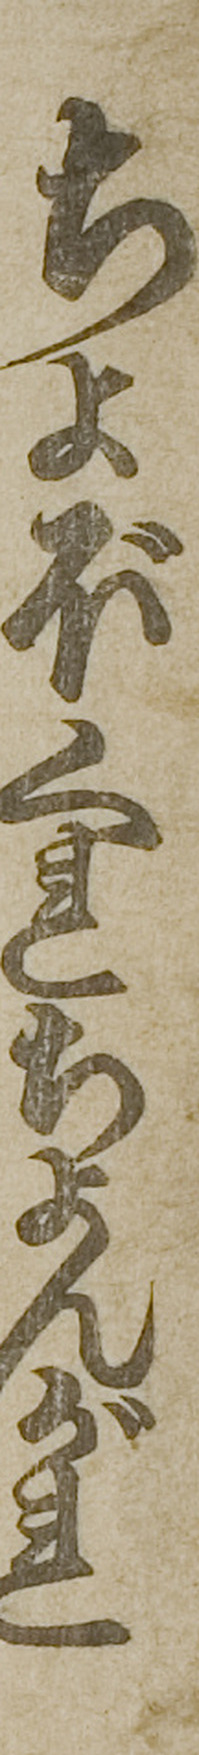ちょぼくれちょんがれ
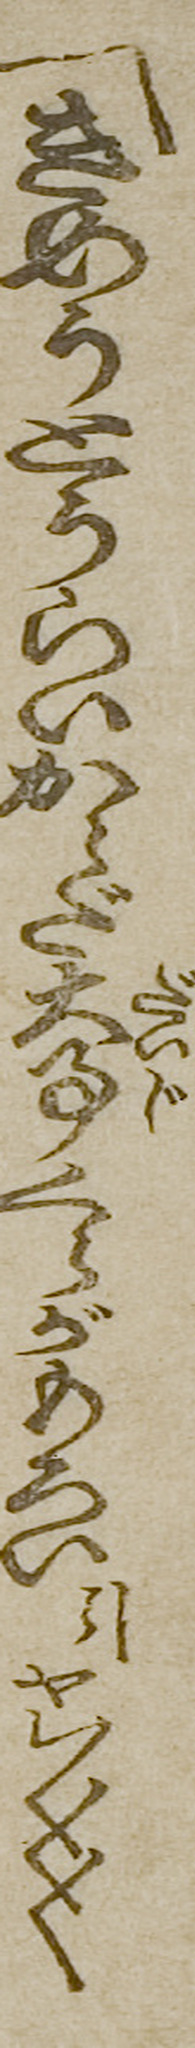〽きめうとうらいからだ大事くらがもろいヤレ〳〵〳〵〳〵
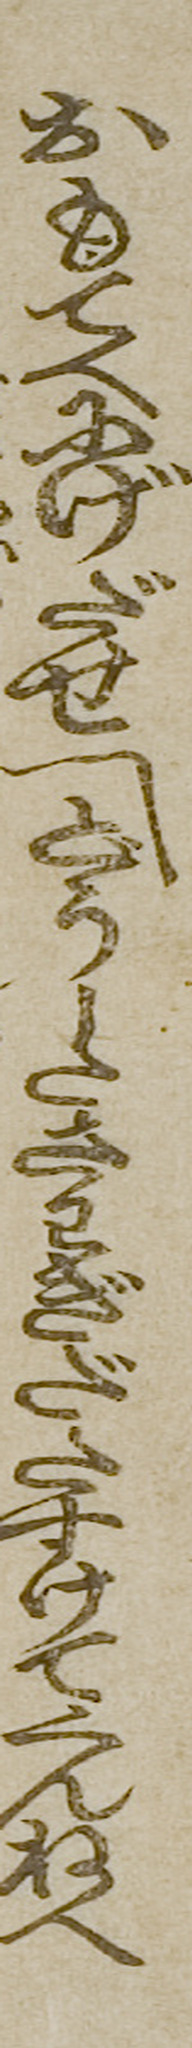おもてへにげだせ〽どうしたさわぎだたすけてくんねへ
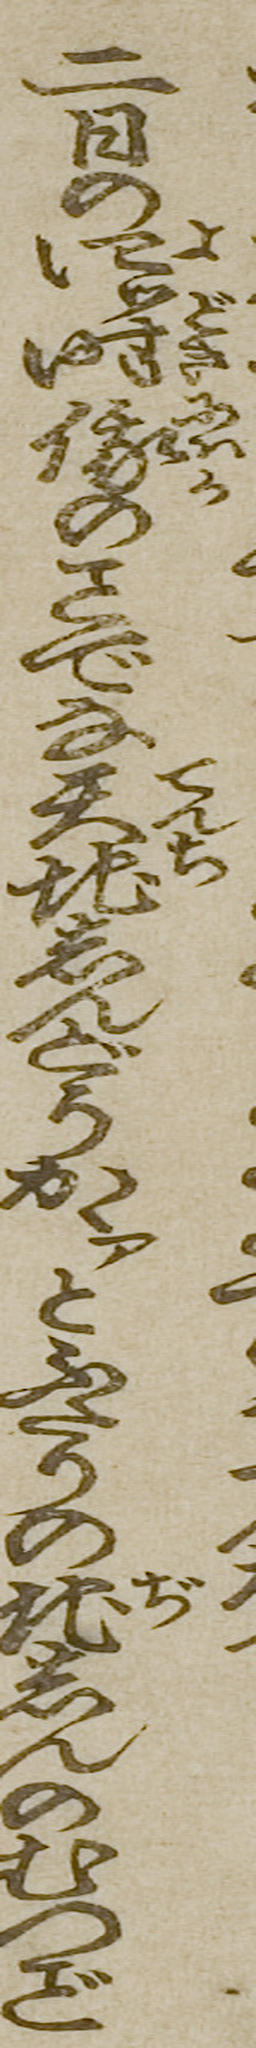二日の四ッ時俄のことでな天地しんどうかゝァとふたりの地しんのむつごと
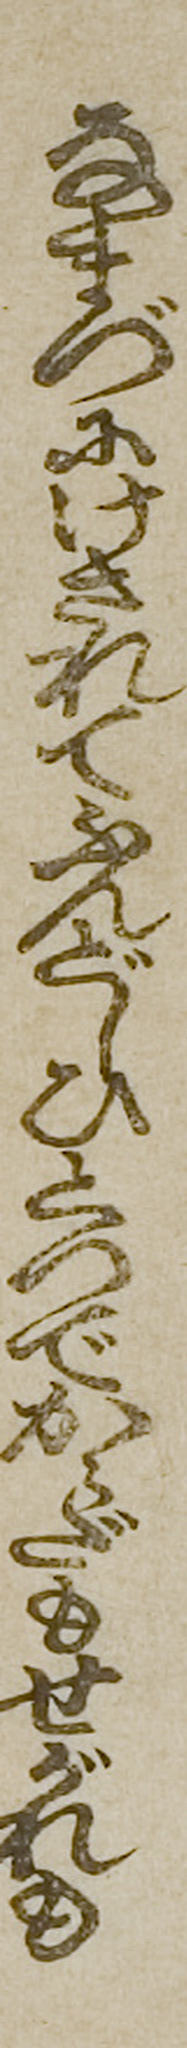なまづにけされてふんどしひとつでからだもせがれも
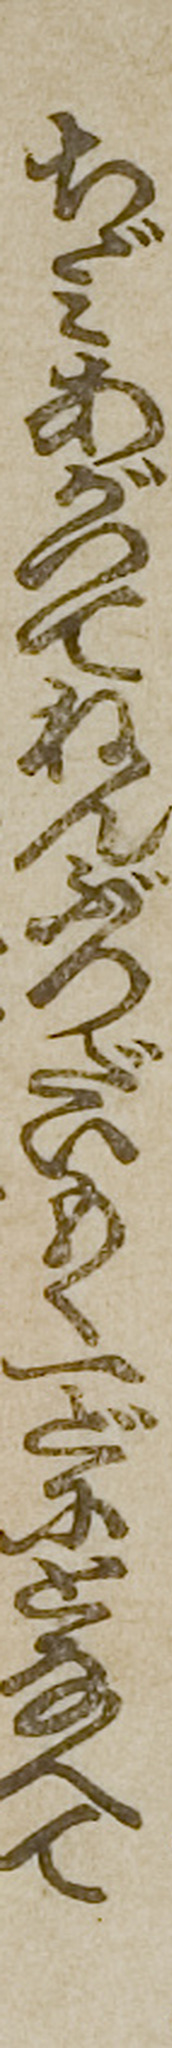ちゞみあがつてねんぶつだいもく一どにとなへて
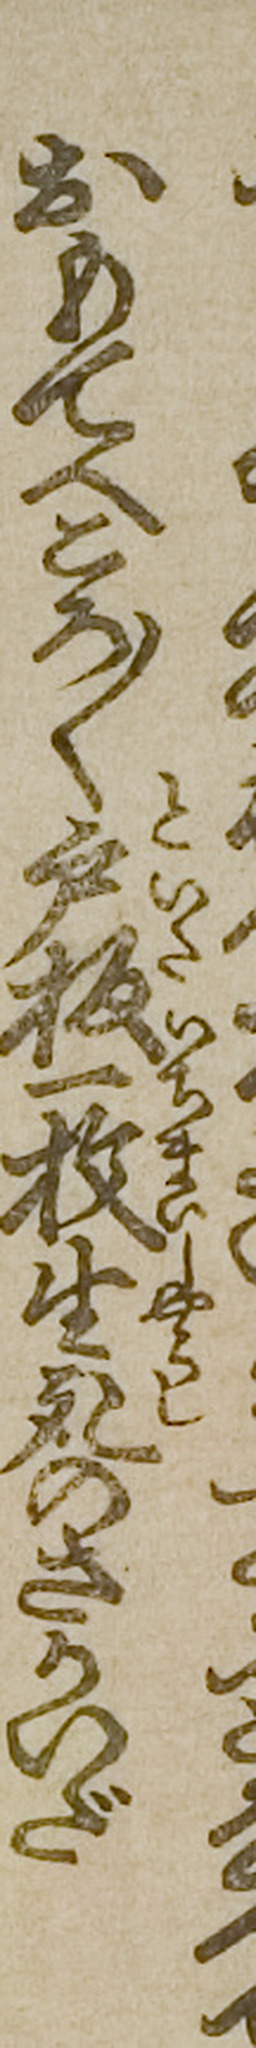おもてへころ〳〵戸板一枚生死のさかいだ
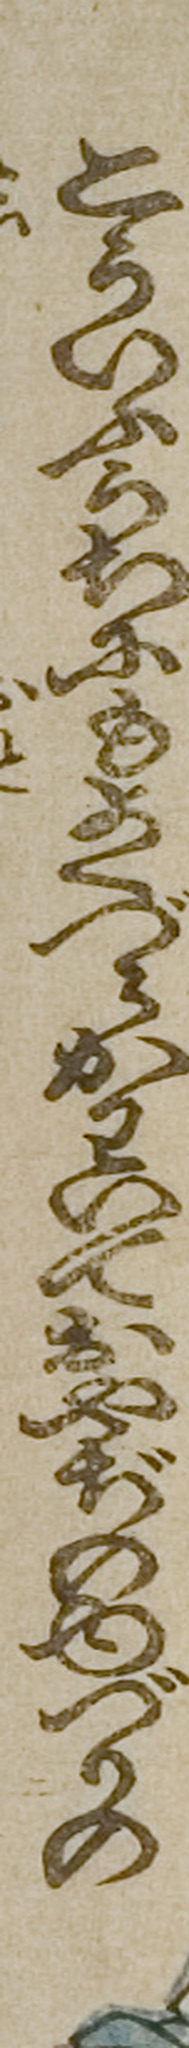こういふうちにもよくづらかわいておやぢのゆづりの
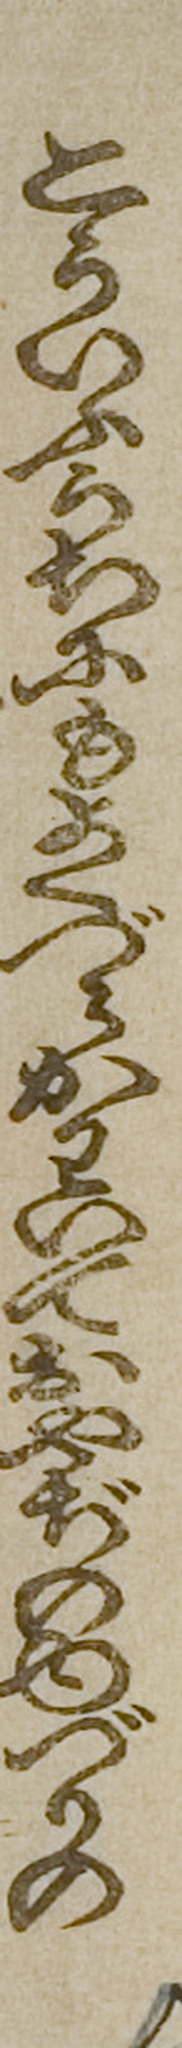こういふうちにもよくづらかわいておやぢのゆづりの
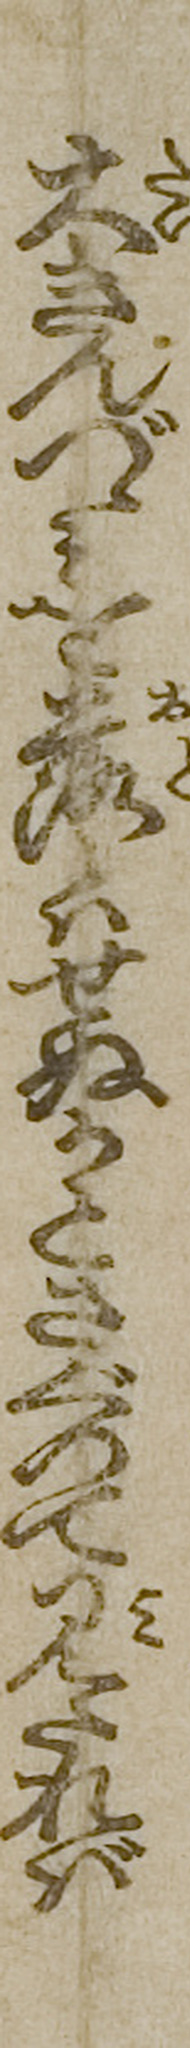大きんづゝみを落しはせぬかとさぐつて見たれば
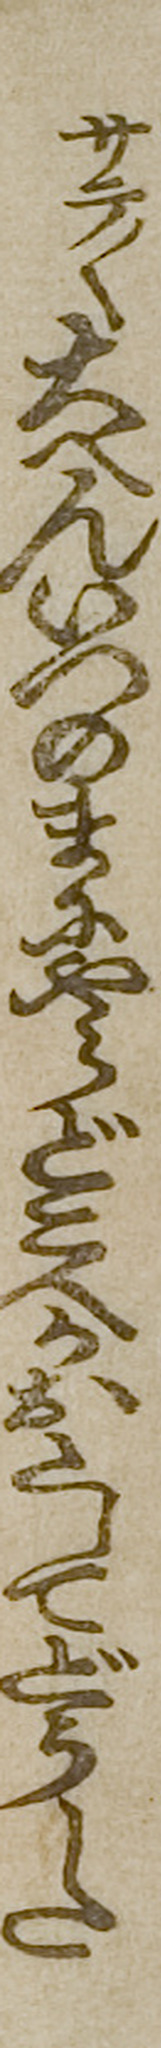サテ〳〵大へんいつのまにやらどこへかおとしてどうした
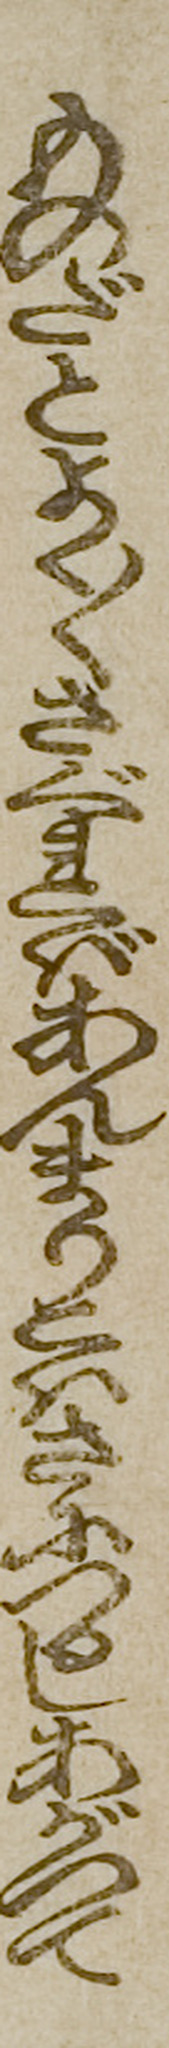ものだとよく〳〵さぐればあんまりこはさにつるしあがつて
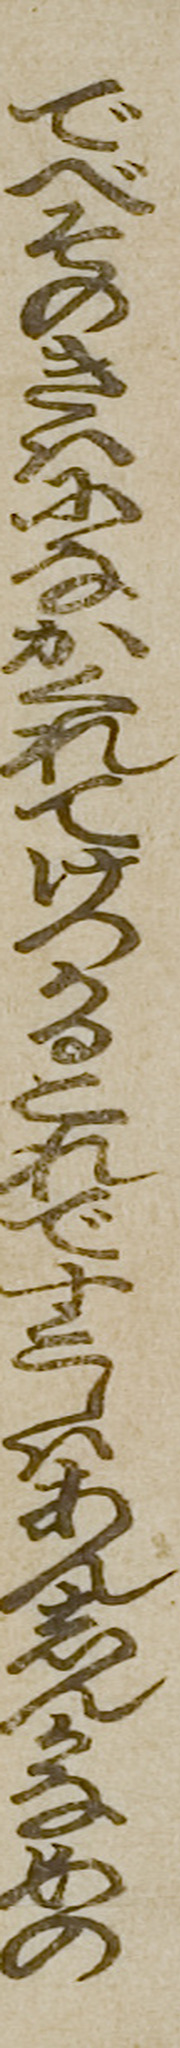でべそのきはになかくれてけつかるこれですこしはあんしんかなめの
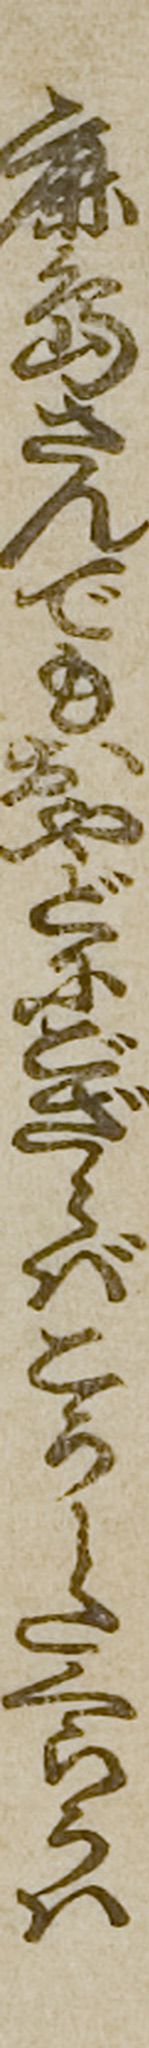鹿島さんでもおやどにござらばこうしてくらうは
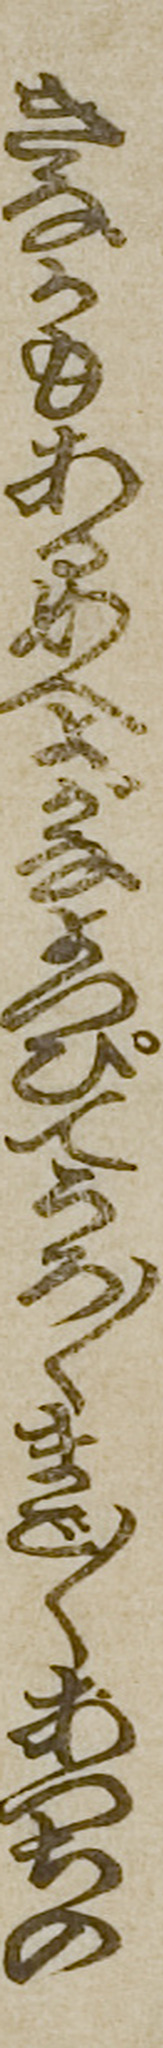きなうもあるめへよがなよつぴてうろ〳〵まご〳〵あつちの
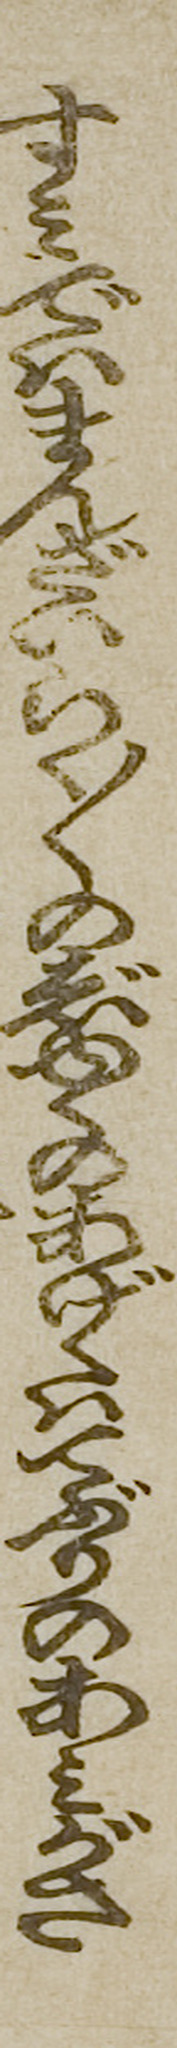すみではまんざいらく〳〵のじゆくのあげくはてぶりのあみがさ
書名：ちょぼくれちょんがれ
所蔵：東京大学総合図書館 General Library in the University of Tokyo, JAPAN
